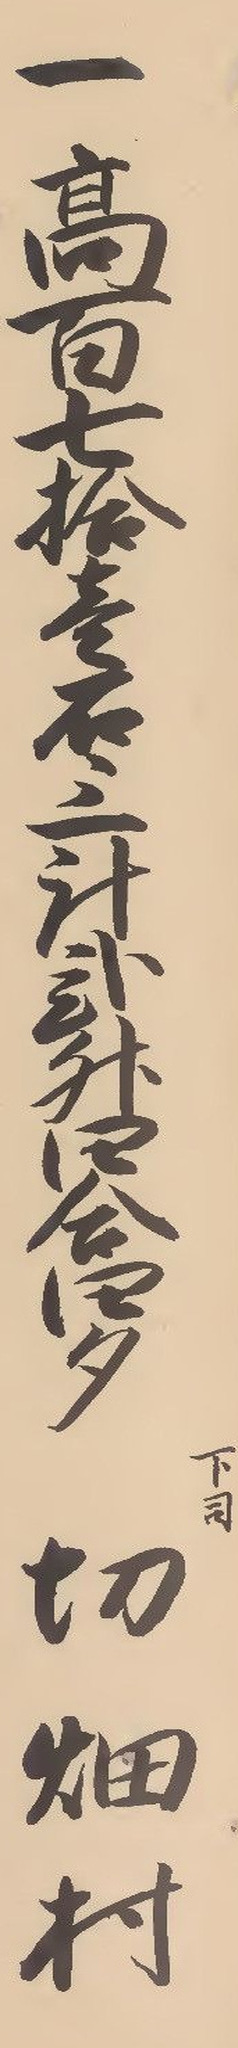一高百七拾壱石三斗弐升四合四勺切畑村
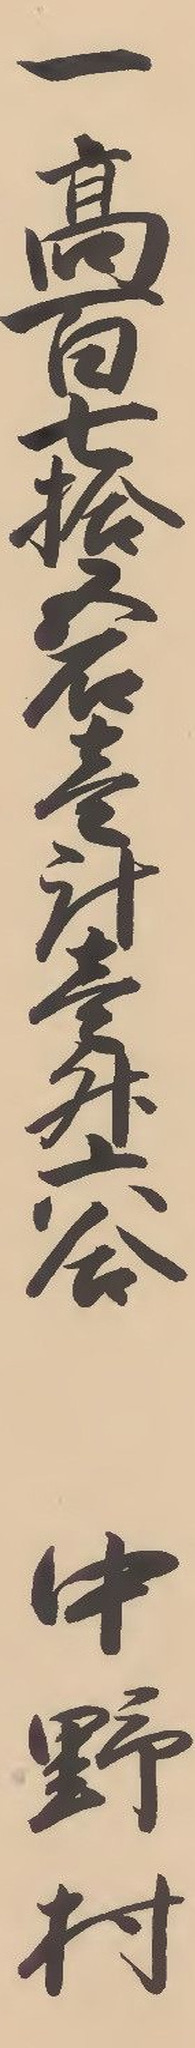一高百七拾五石壱斗壱升六合中野村
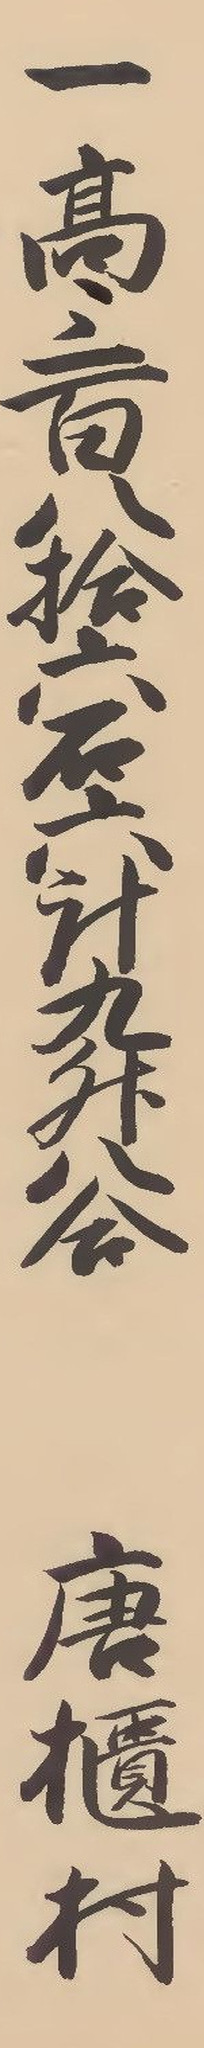一高三百八拾六石六斗九升八合唐櫃村
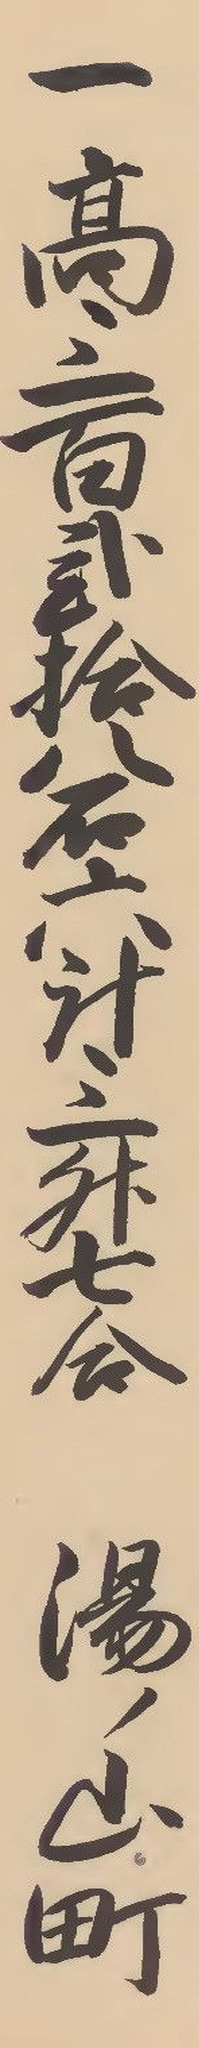一高三百弐拾八石六斗三升七合湯ノ山町

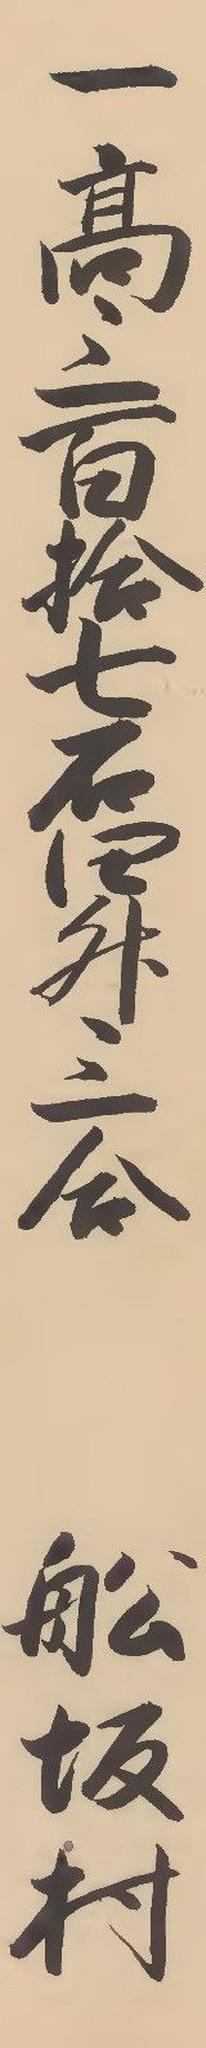一高三百拾七石四升三合船坂村
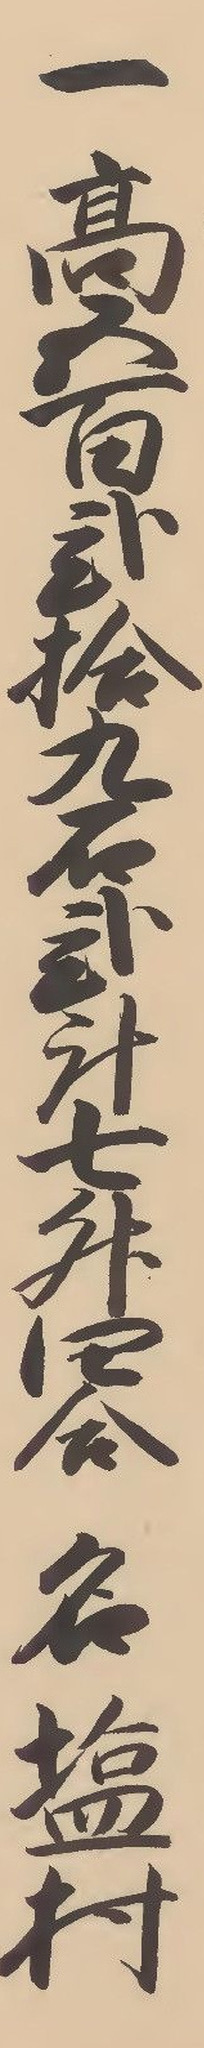一高五百弐拾九石弐斗七升四合名塩村
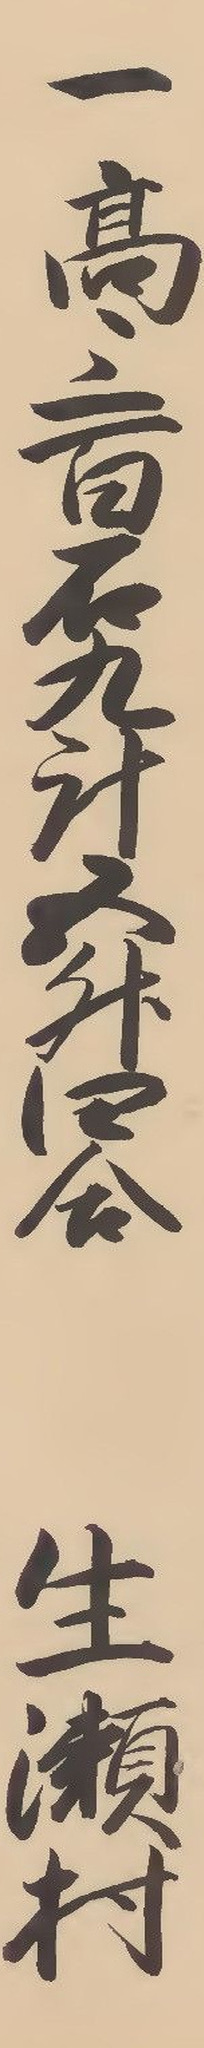一高三百石九斗五升四合生瀬村
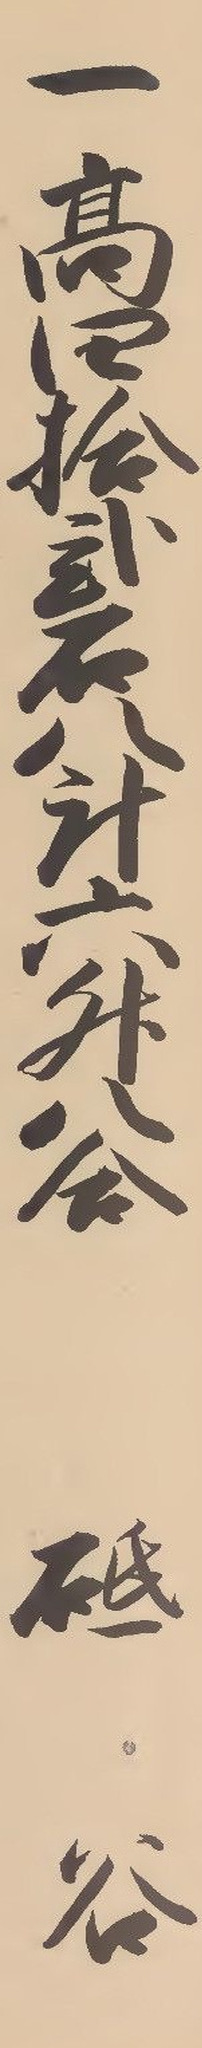一高四拾弐石八斗六升八合砥谷
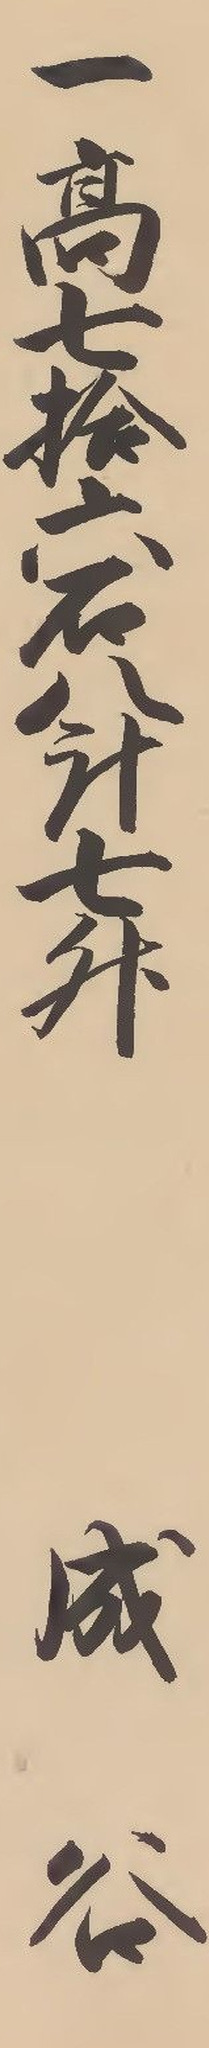一高七拾六石八斗七升成谷
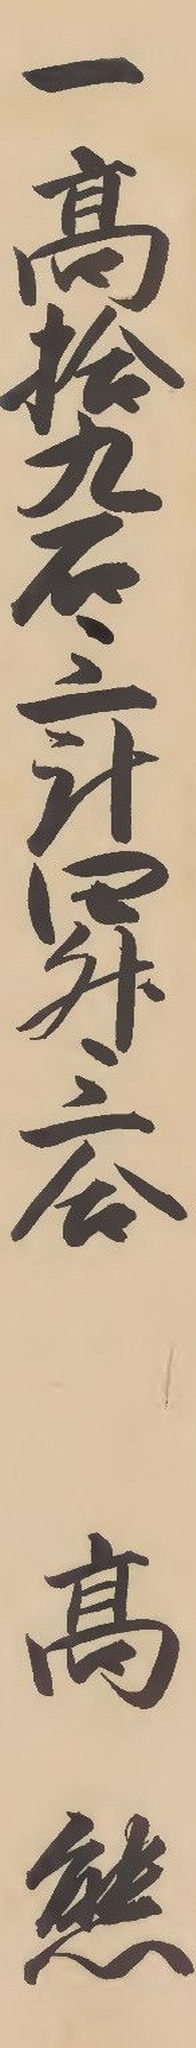一高拾九石三斗四升三合高熊
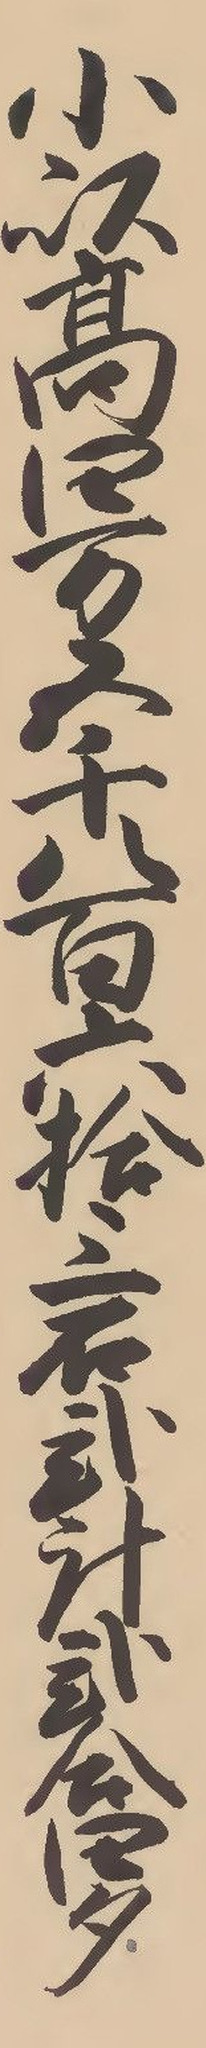小以高四万五千八百六拾三石弐斗弐合四勺

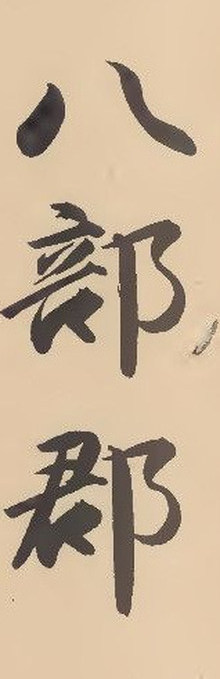八部郡
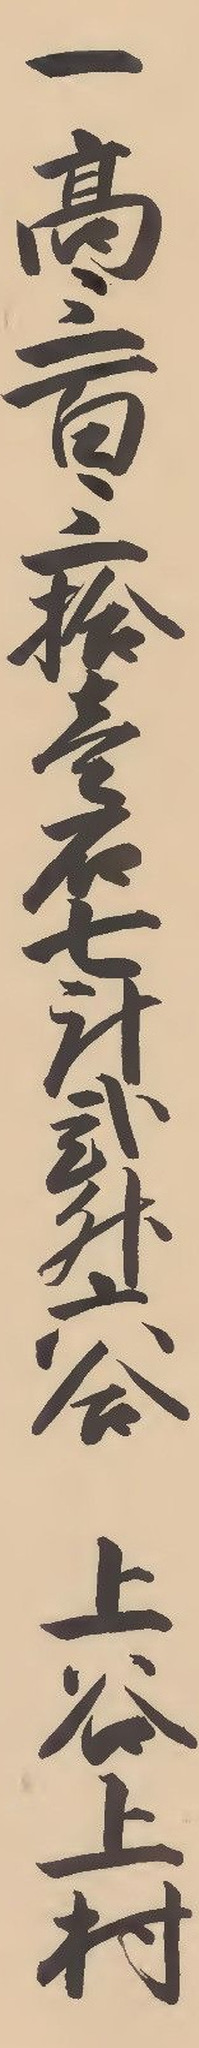一高三百三拾壱石七斗弐升六合上谷上村
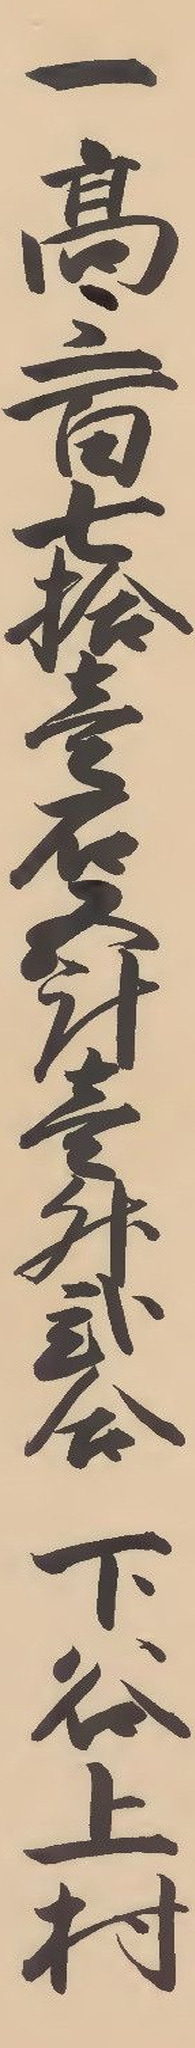一高三百七拾壱石五斗壱升弐合下谷上村
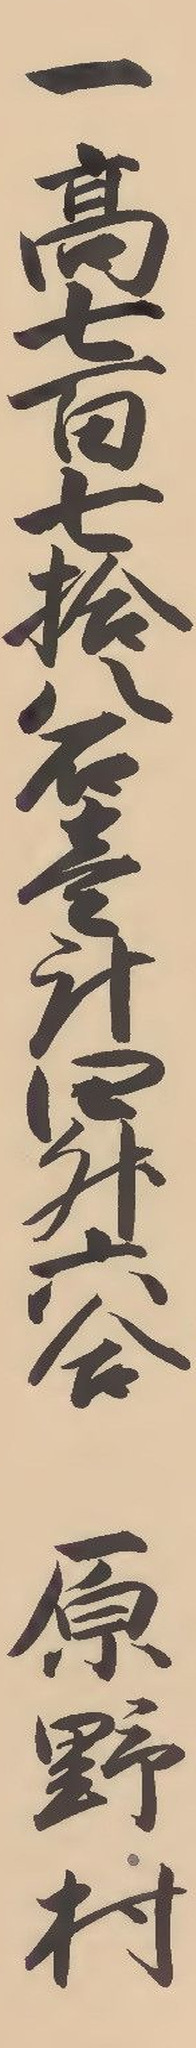一高七百七拾八石壱斗四升六合原野村

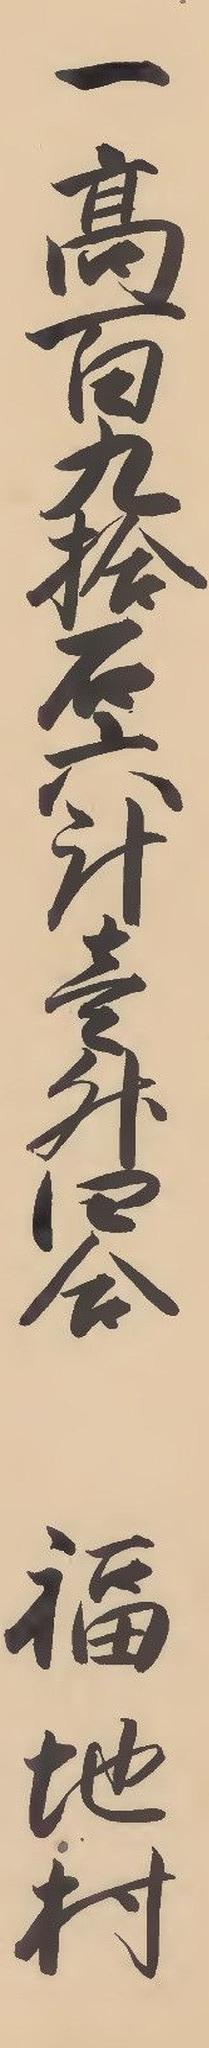一高百九拾石六斗壱升四合福地村
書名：摂津国郷帳
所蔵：国立公文書館 National Archives of Japan
